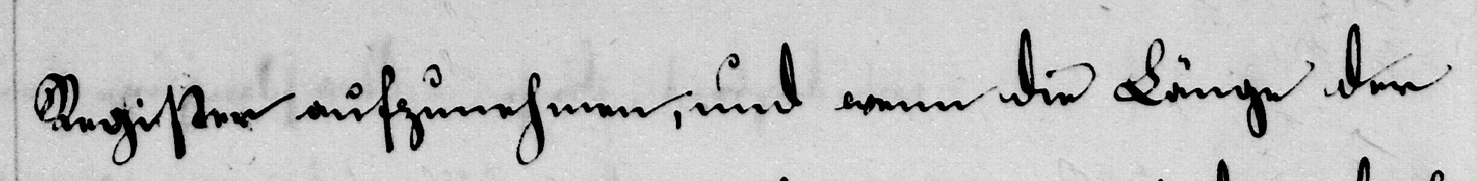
Register aufzunehmen, und wenn die Länge der
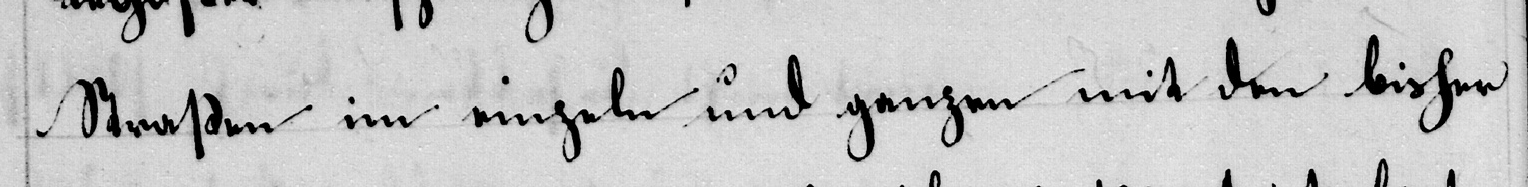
Straßen im einzeln und ganzen mit den bisher
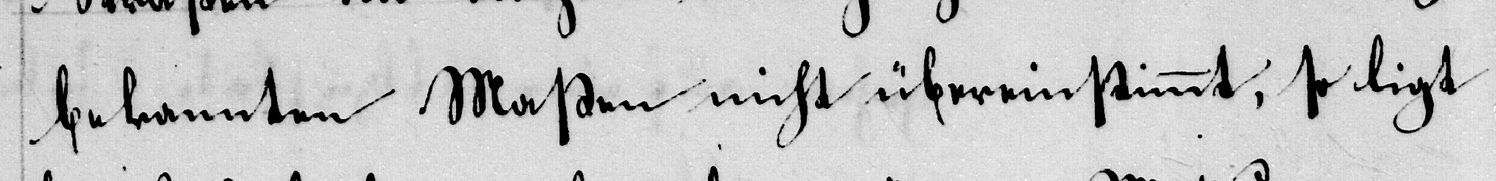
bekannten Maßen nicht übereinstimmt, so liegt
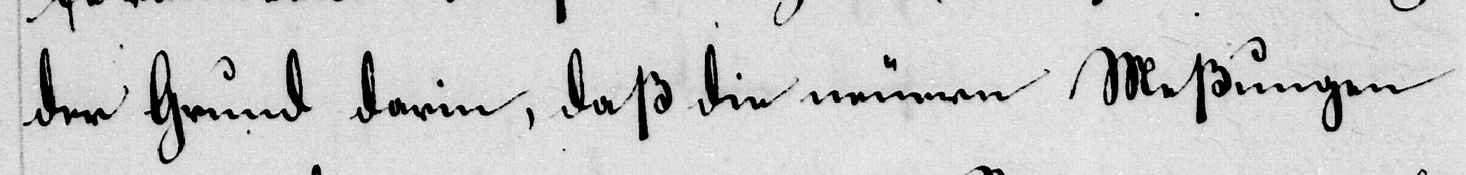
der Grund darin, daß die neuren Meßungen
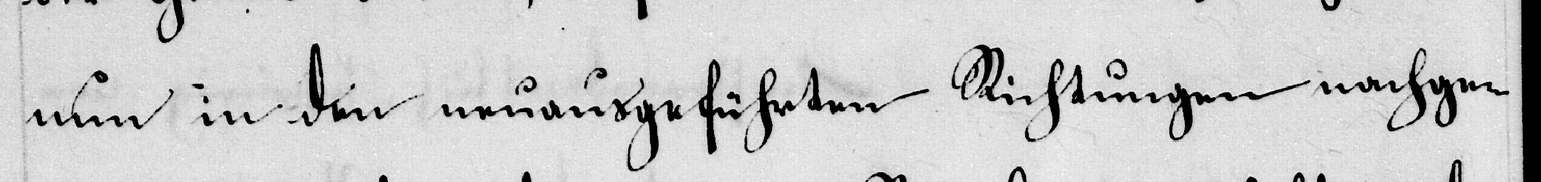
nun in den unausgeführten Richtungen nachge¬
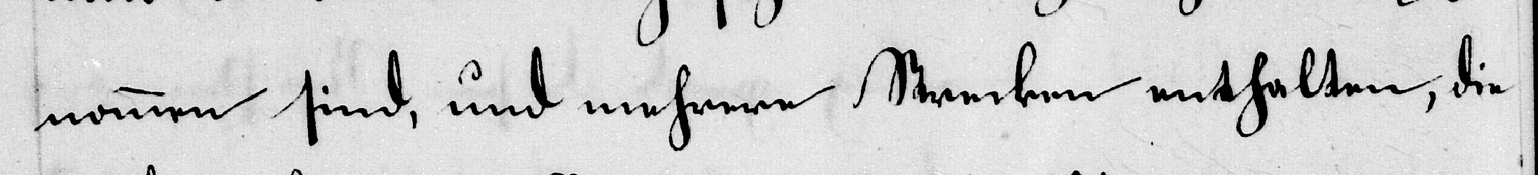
nommen sind, und mehrere Strecken enthalten, die
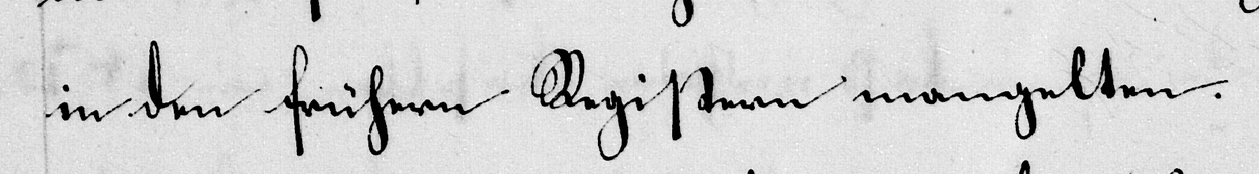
in den frühern Registern mangelten.
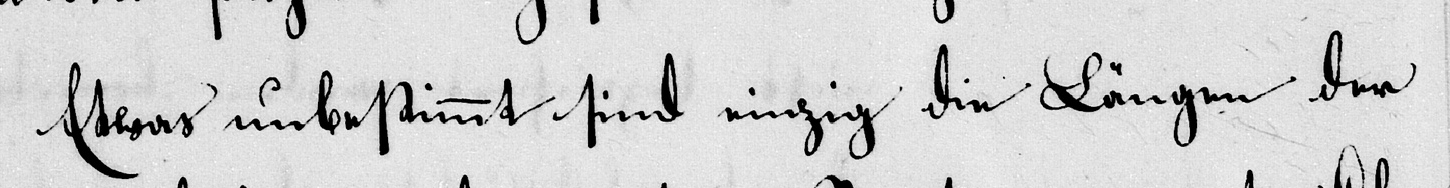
Etwas unbestimmt sind einzig die Längen der
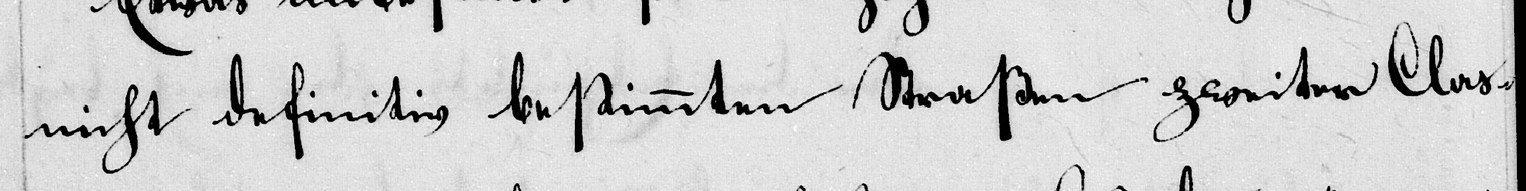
nicht definitiv bestimmten Straßen zweiter Cla¬
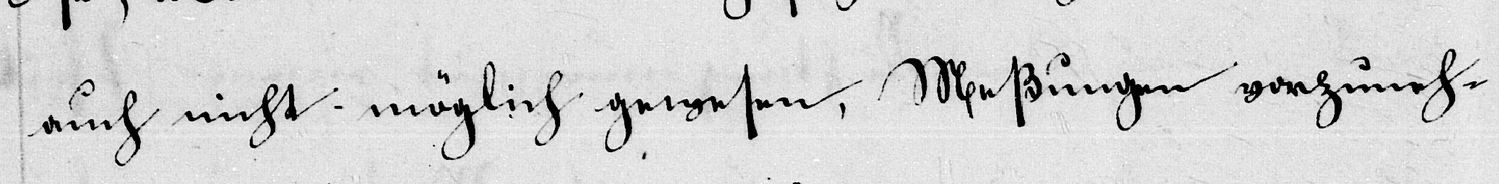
auch nicht möglich gewesen, Meßungen vorzuneh¬
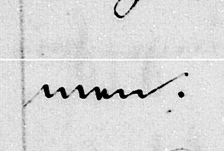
men.
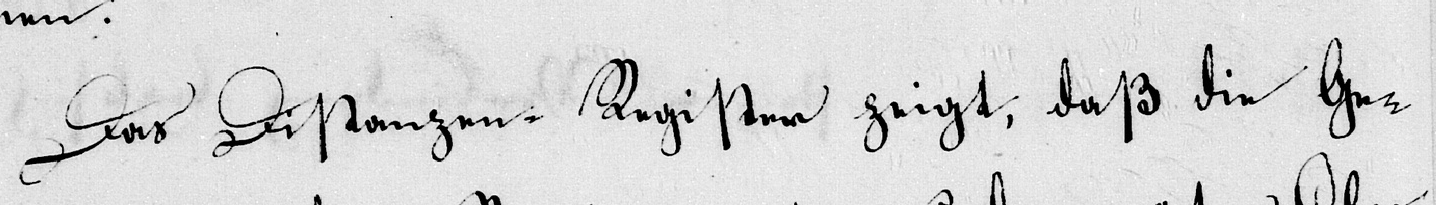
Das Distanzen-Register zeigt, daß die Ge¬
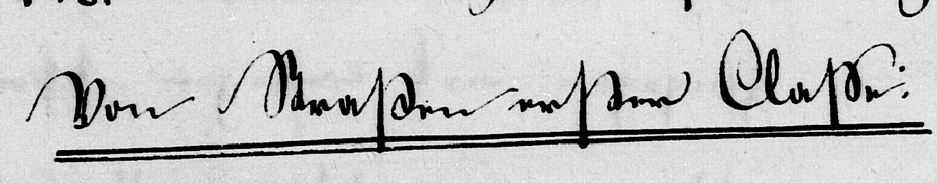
Von Straßen erster Claße:
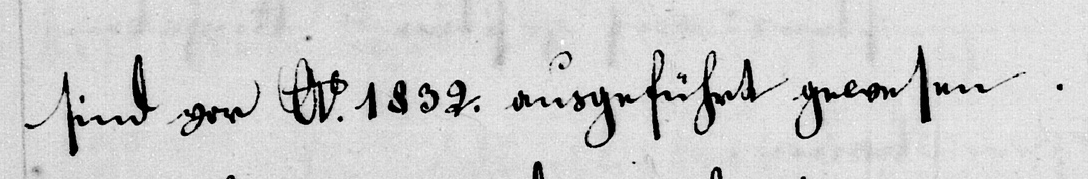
sind vor A°. 1832. ausgeführt gewesen
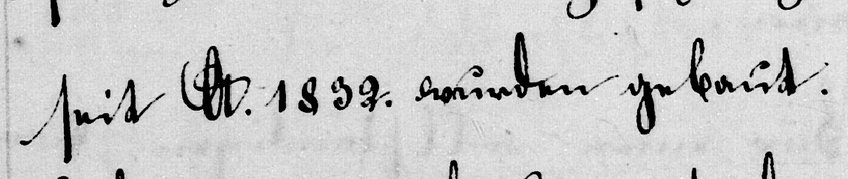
seit A. 1832. wurden gebaut
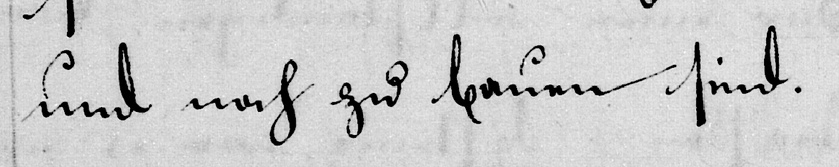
und noch zu bauen sind
